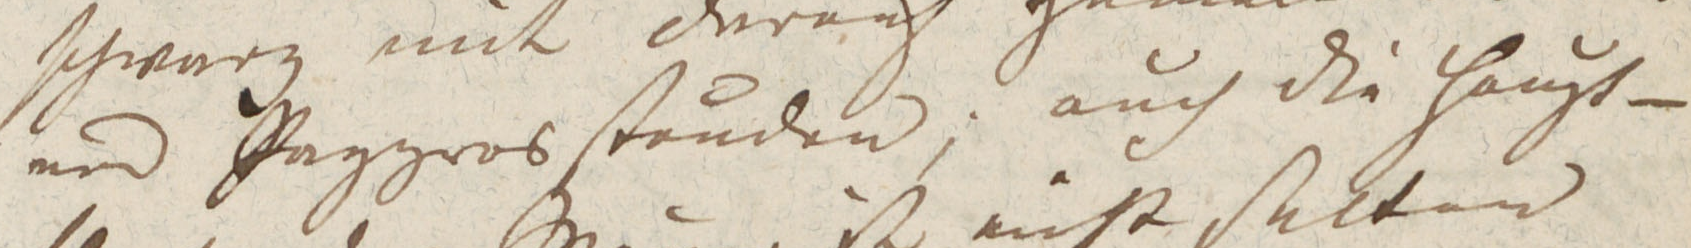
und Papyros stauden; auch die Haupt-
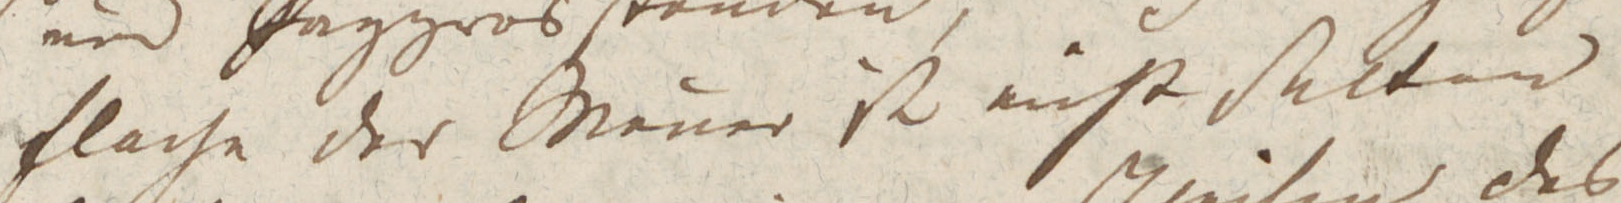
flache der Mauer ist nicht selten
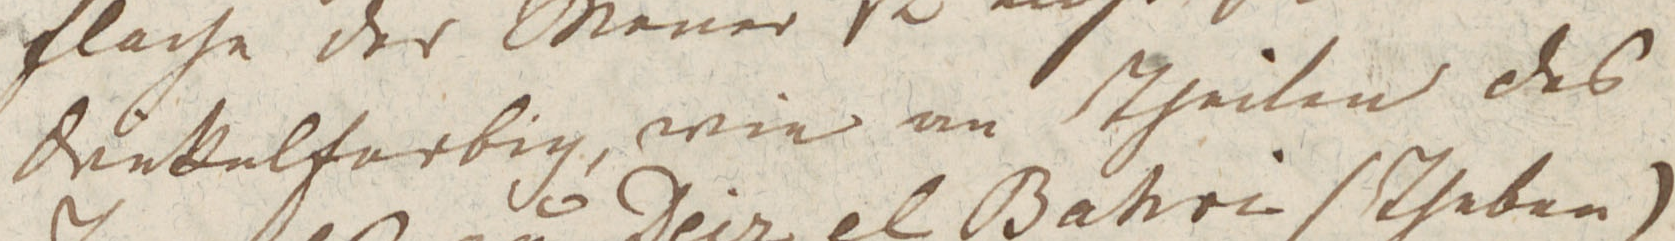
dunkelfarbig, wie an Theilen des
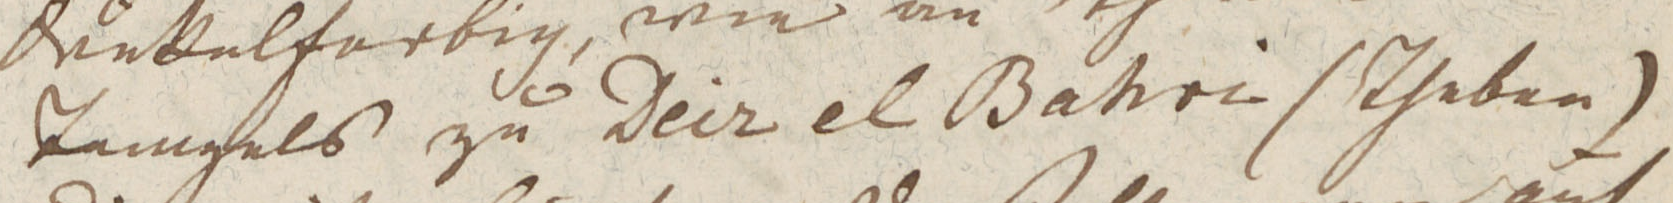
Tempels zu Deir el Bahri (Theben)
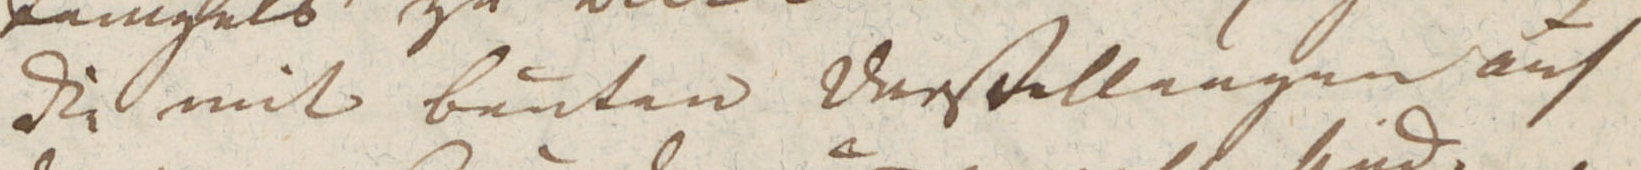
die mit bunten Darstellungen auf
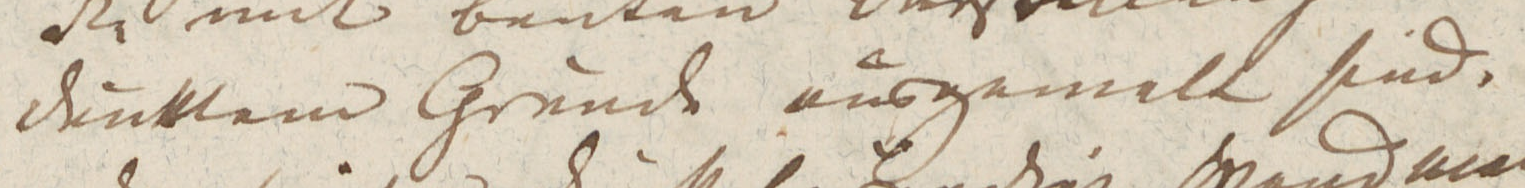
dunklem Grunde ausgemalt sind.
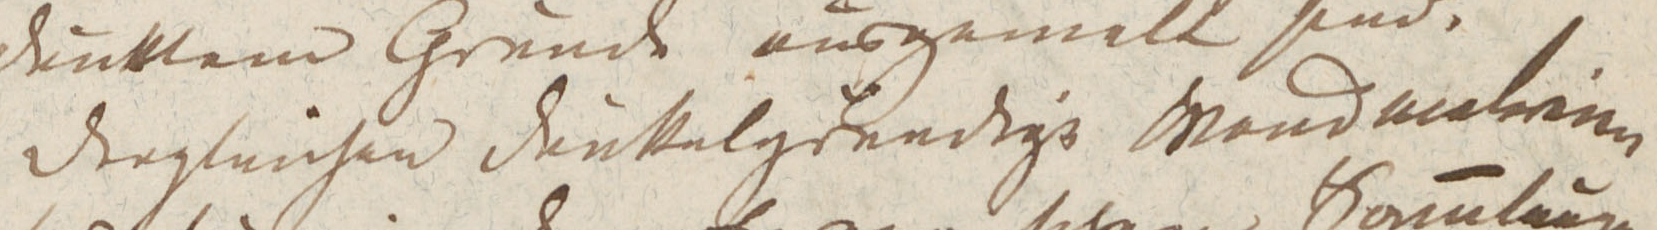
Dergleichen dunkelgründige Wandmalereien
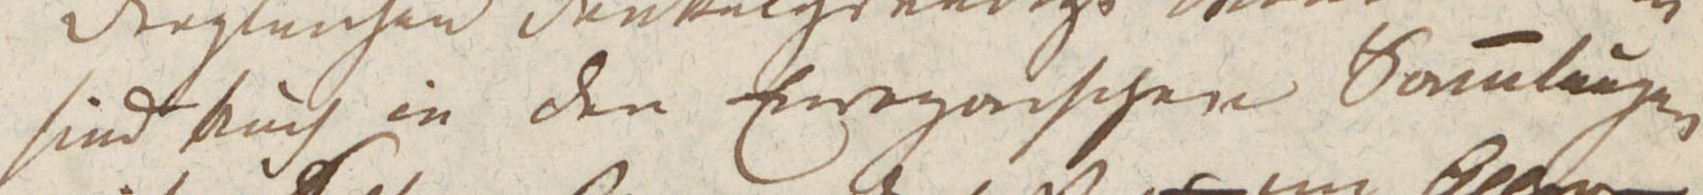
sind sauch in den Europaischen Sammlungen
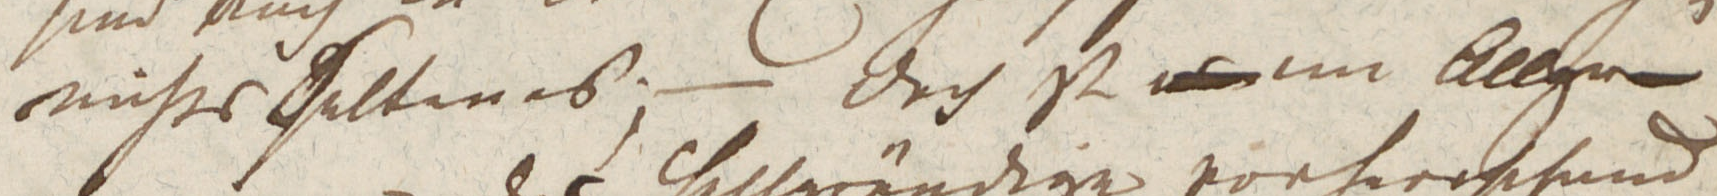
nichts sSeltenes; – Doch ist es im Allge-
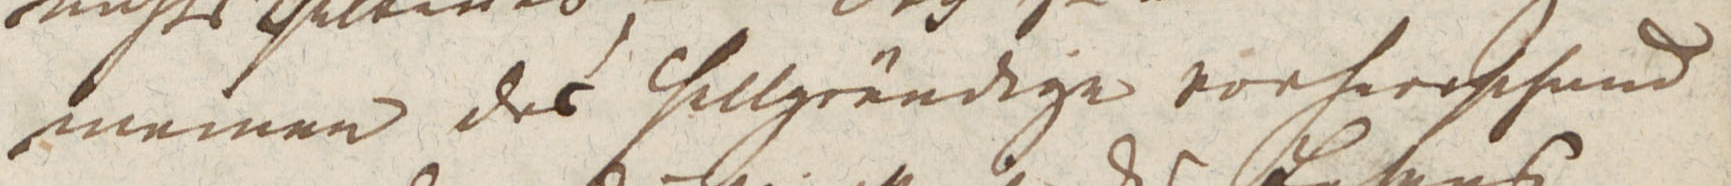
meinen das Hellgründige vorherrschend
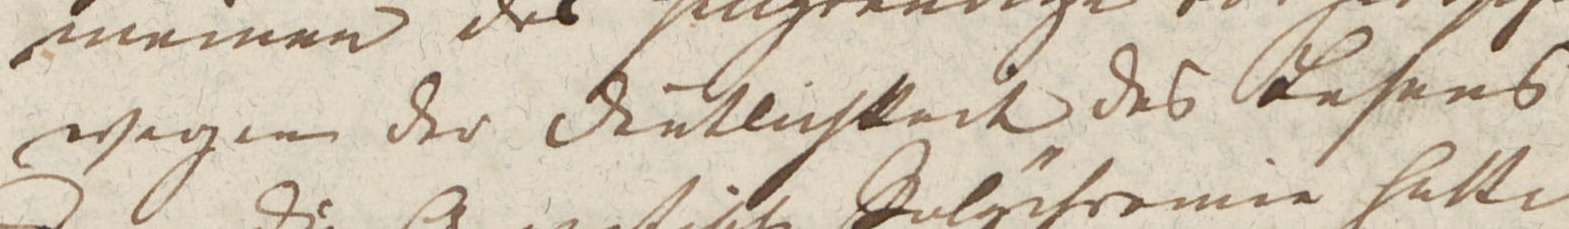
wegen der Deutlichkeit des Lesens
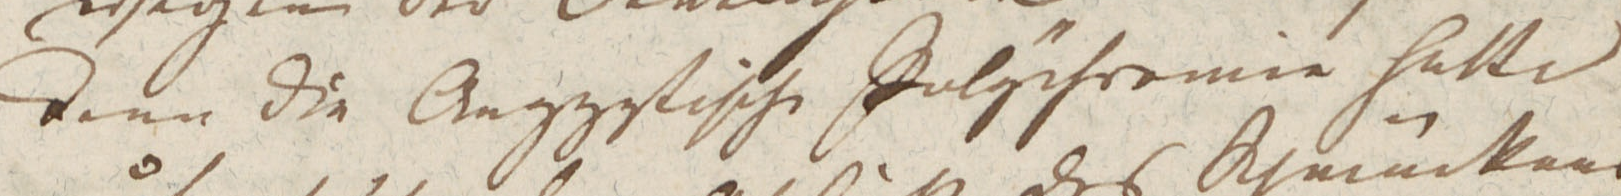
denn die Aegyptische Polychromie hatte
